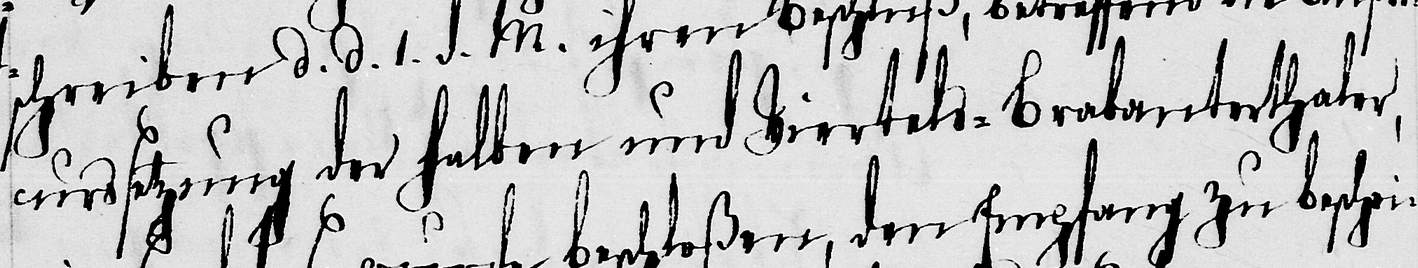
urssetzung der halben und Viertels-Brabanterthal¬
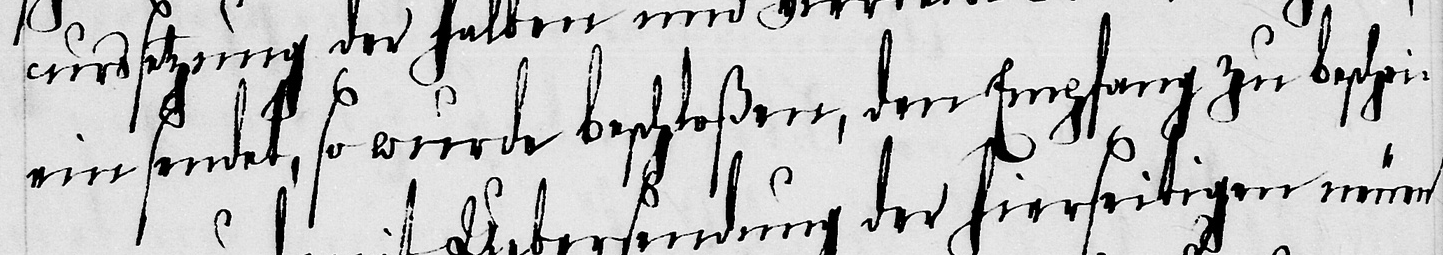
einsendet, so wurde beschloßen, den Empfang zu besche¬
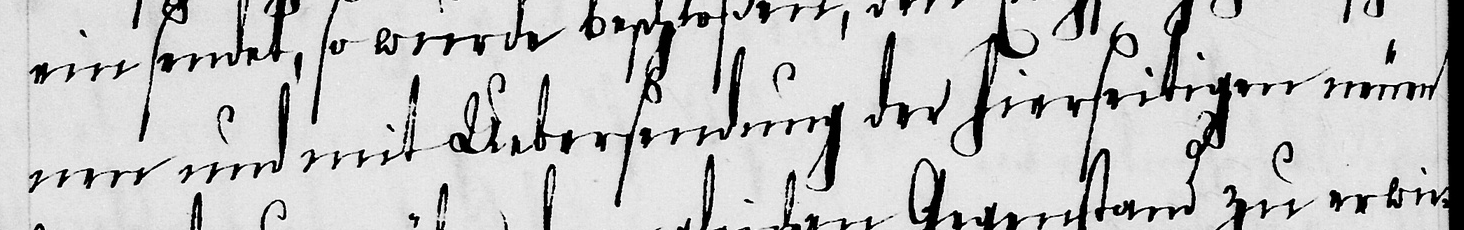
inen und mit Uebersendung der hierseitigen neuen
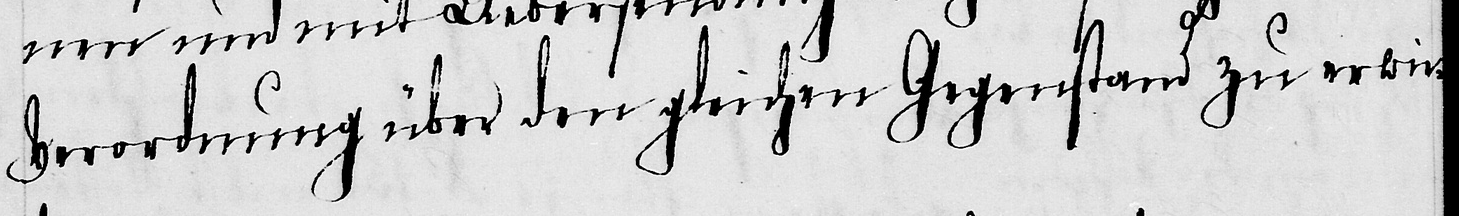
Verordnung über den gleichen Gegenstand zu erwie¬
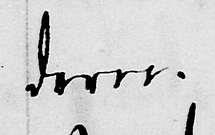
dern.
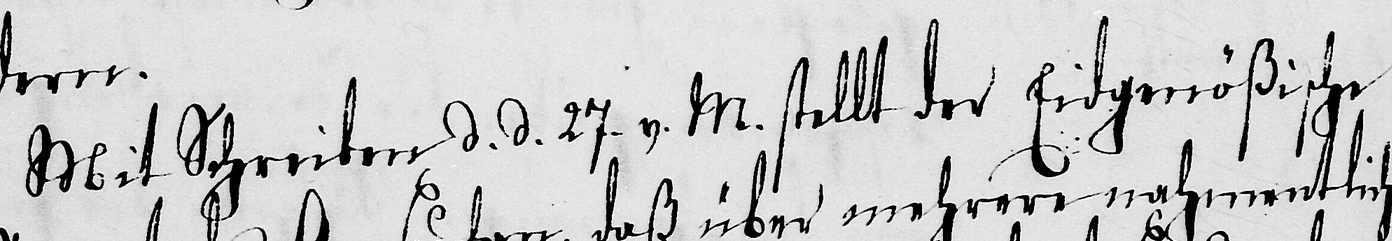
Mit Schreiben d. d. 27. v. M. stellt der Eidgenößische
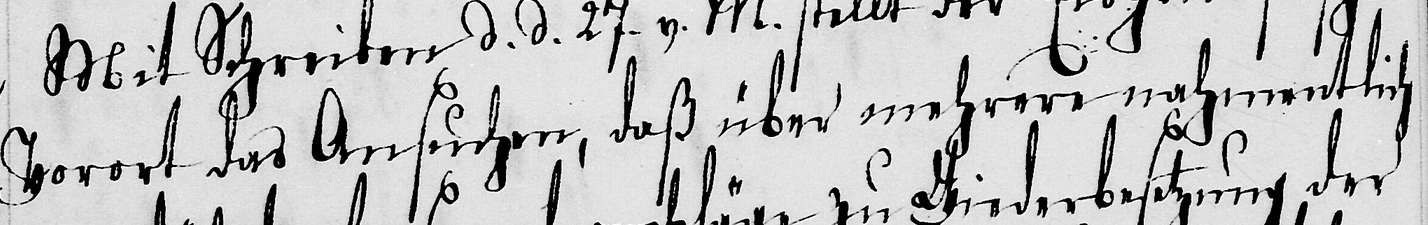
Vorort das Ansuchen, daß über mehrere nahmentlich
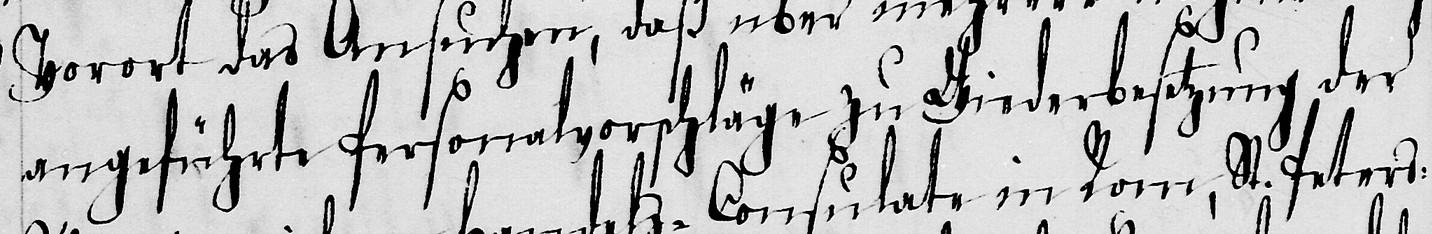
angeführte Personalvorschläge zu Wiederbesetzung der
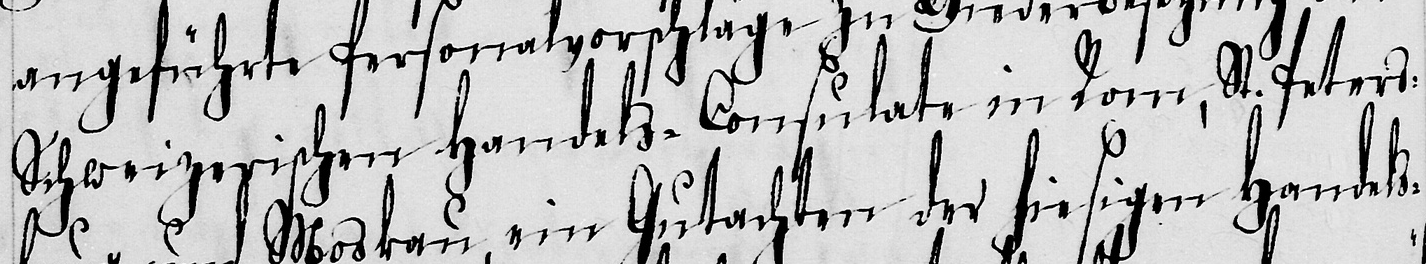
Schweizerischen Handels-Consulate in Rom, St. Peter¬
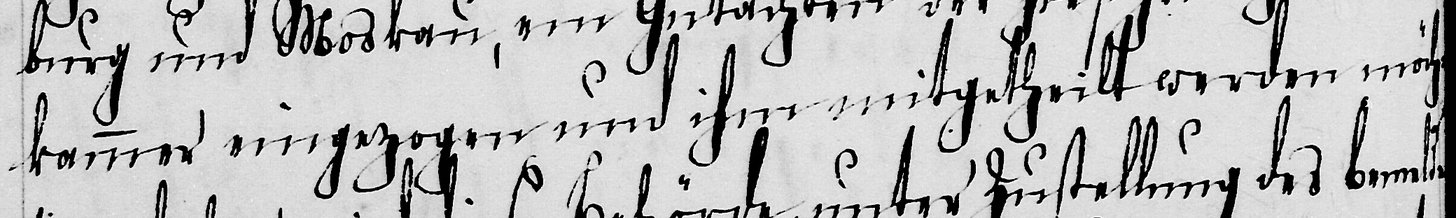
skammer eingezogen und ihm mitgetheilt werden möch¬
